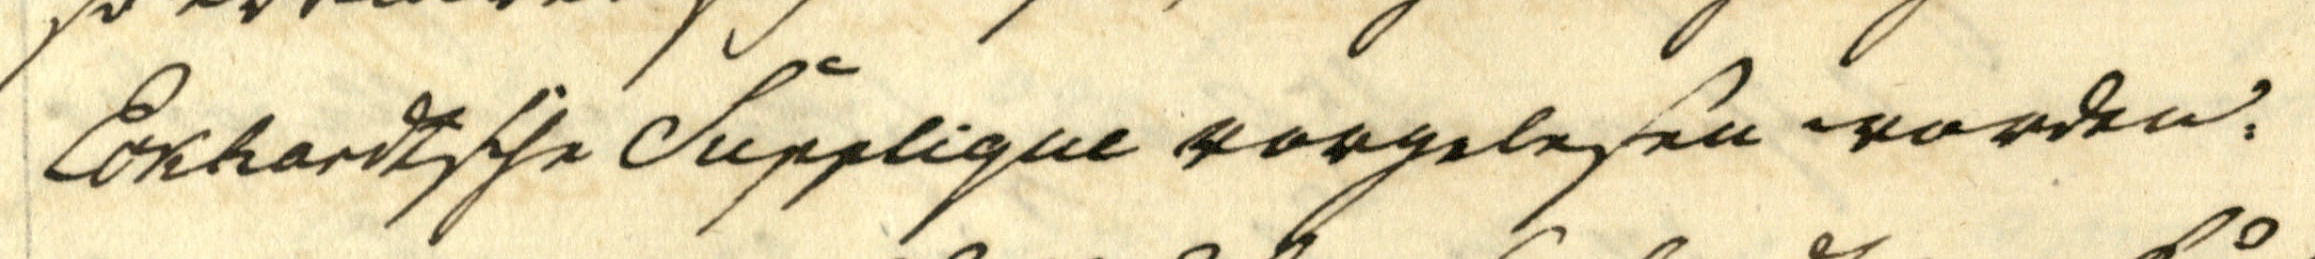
Eckhardtsche Supplique vorgelesen worden:
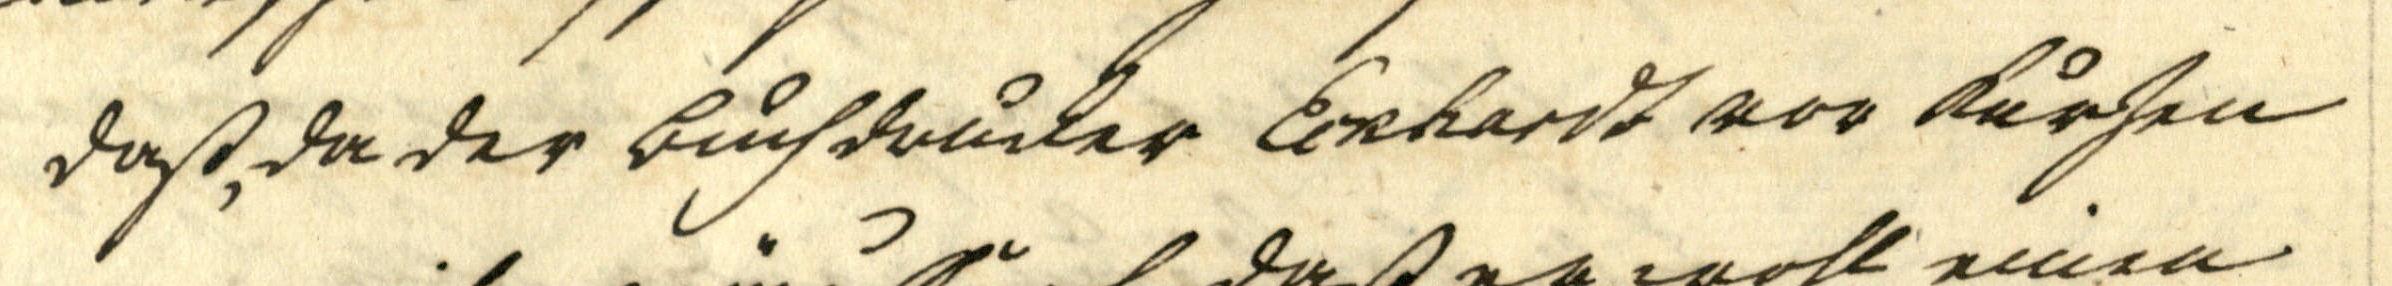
daß, da der Buchdrucker Eckhardt vor kurzen
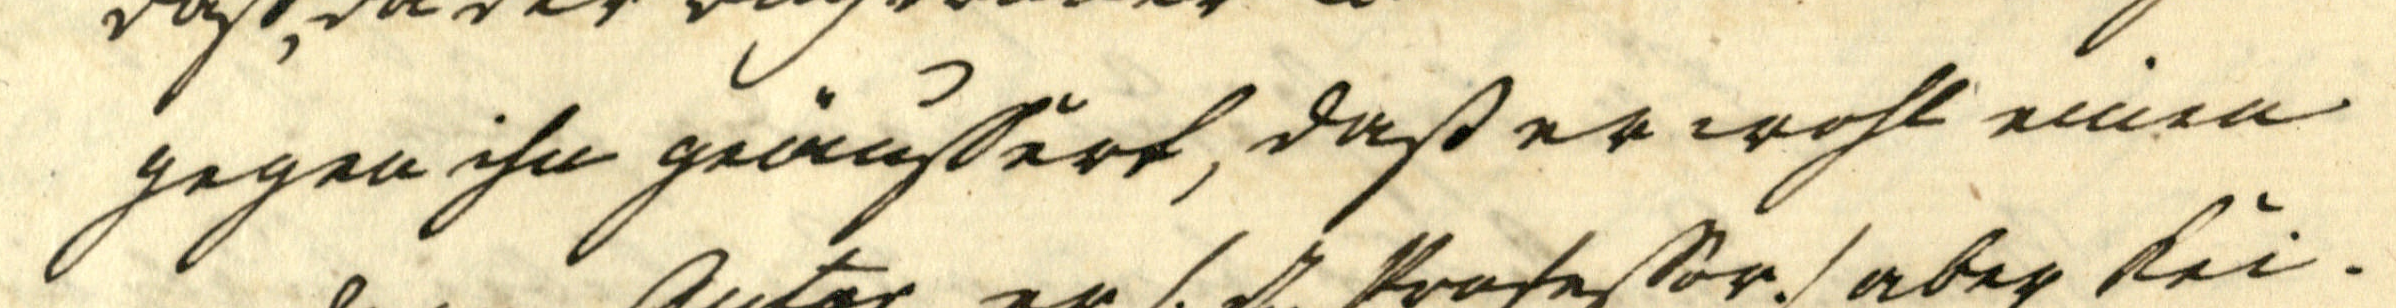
gegen ihn geäussert, daß er wohl einen
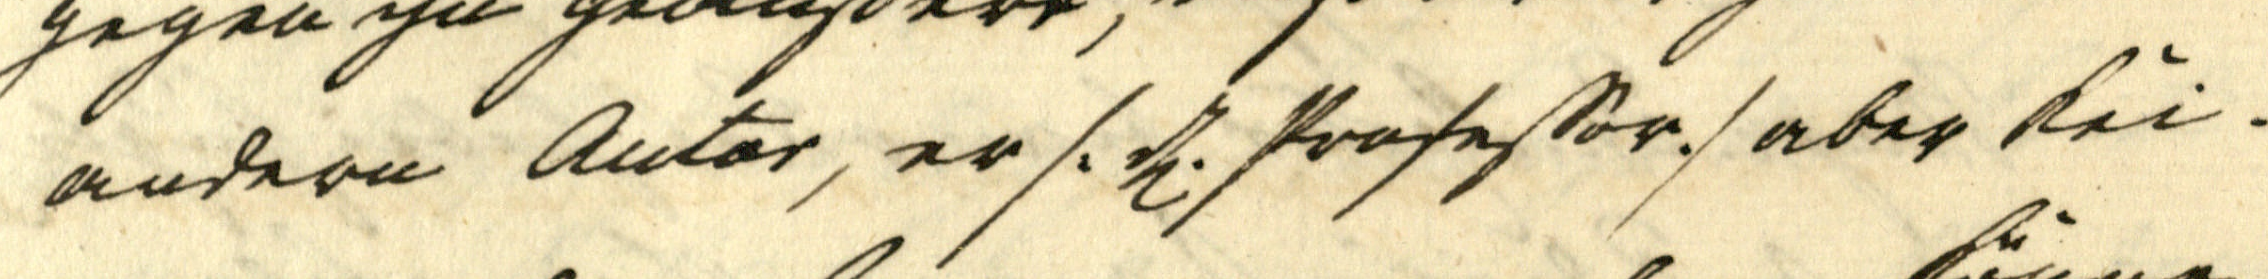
andern Autor, er /:dh. Professor./ aber kei¬
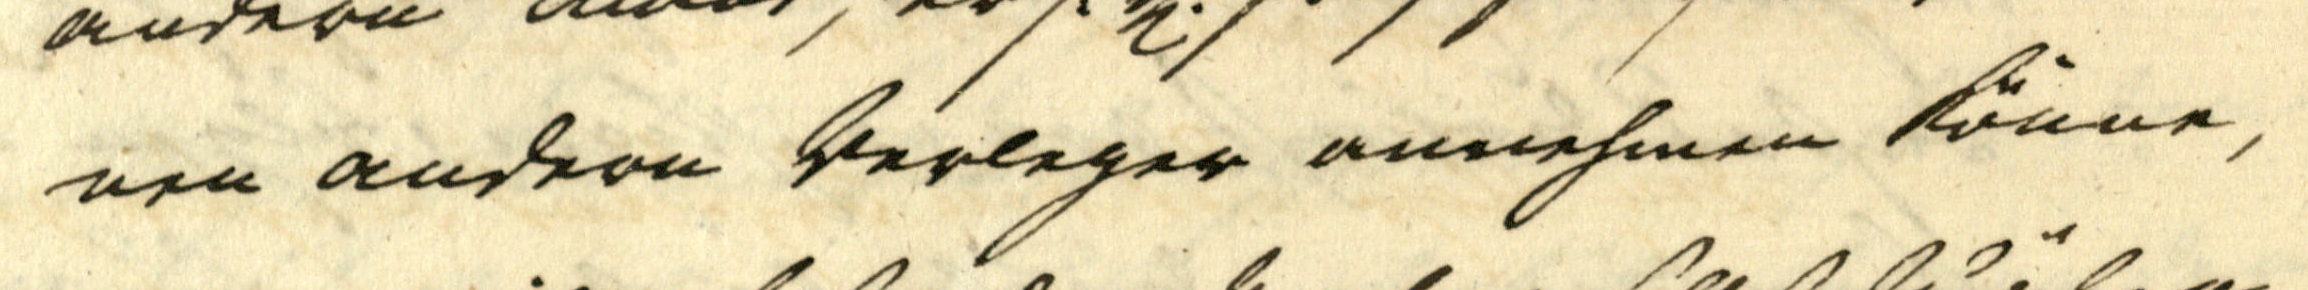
nen andern Verleger annehmen könne,
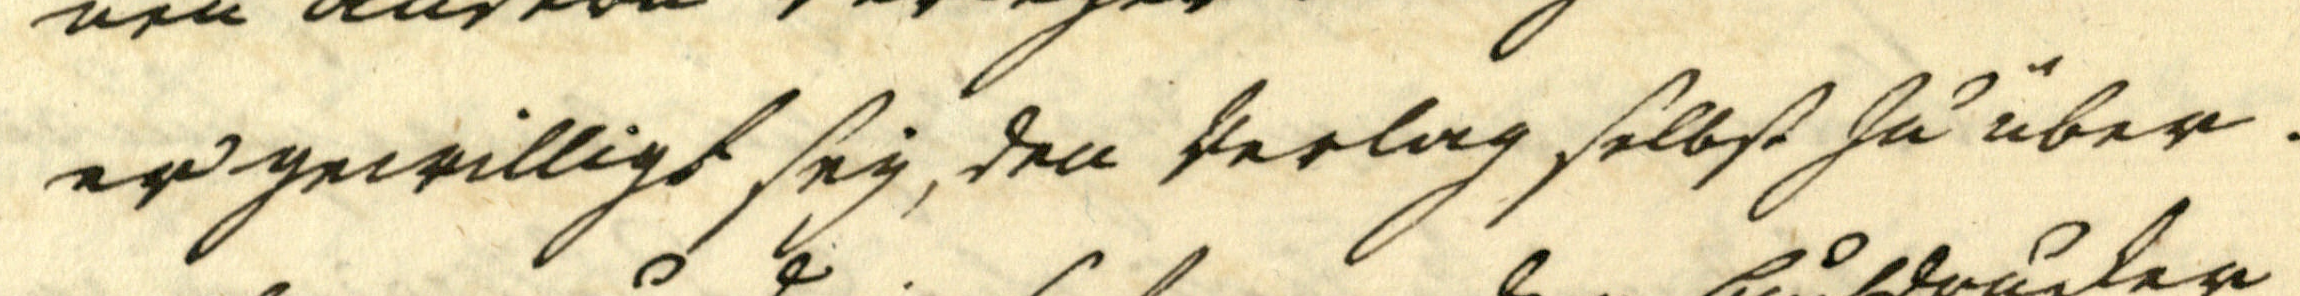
er gewilligt seÿ, den Verlag selbst zu über¬
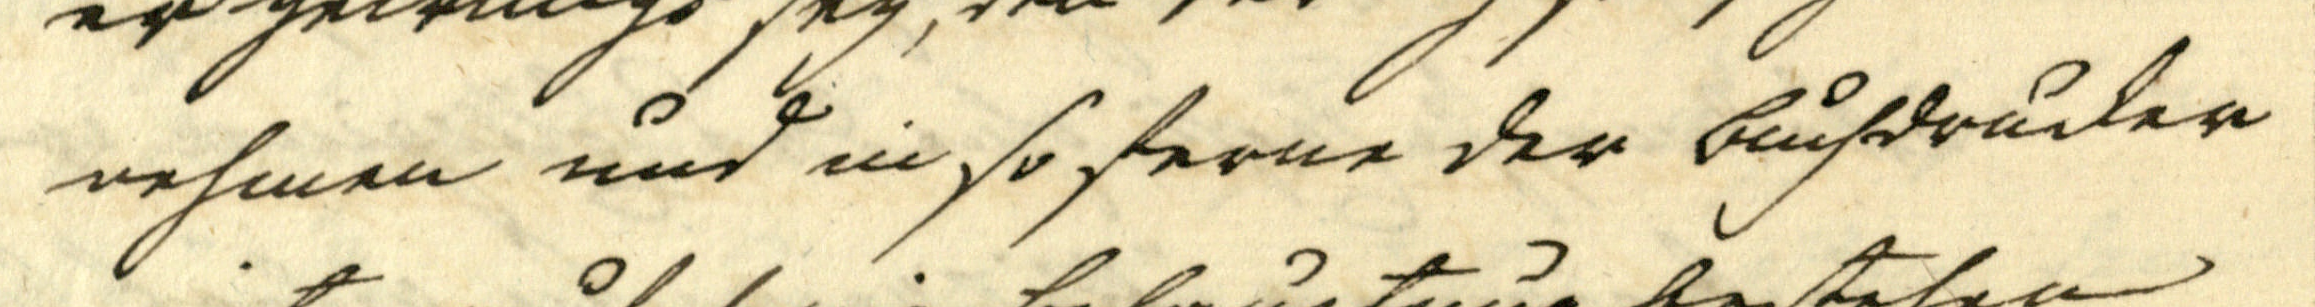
nehmen und in so ferne der Buchdrucker
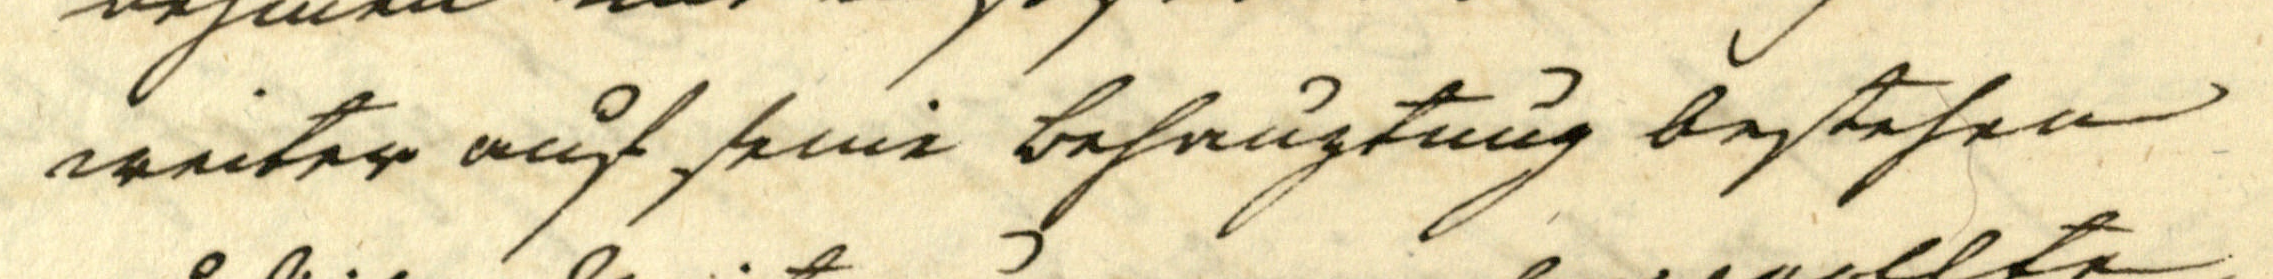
weiter auf seine Behauptung bestehen
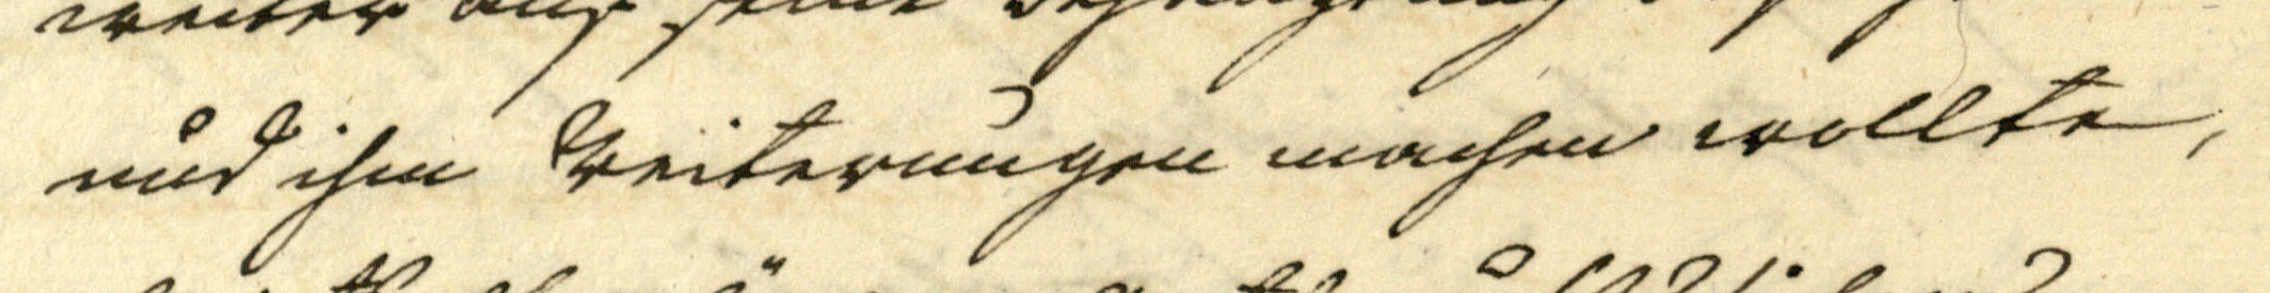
und ihm Weiterungen machen wollte,
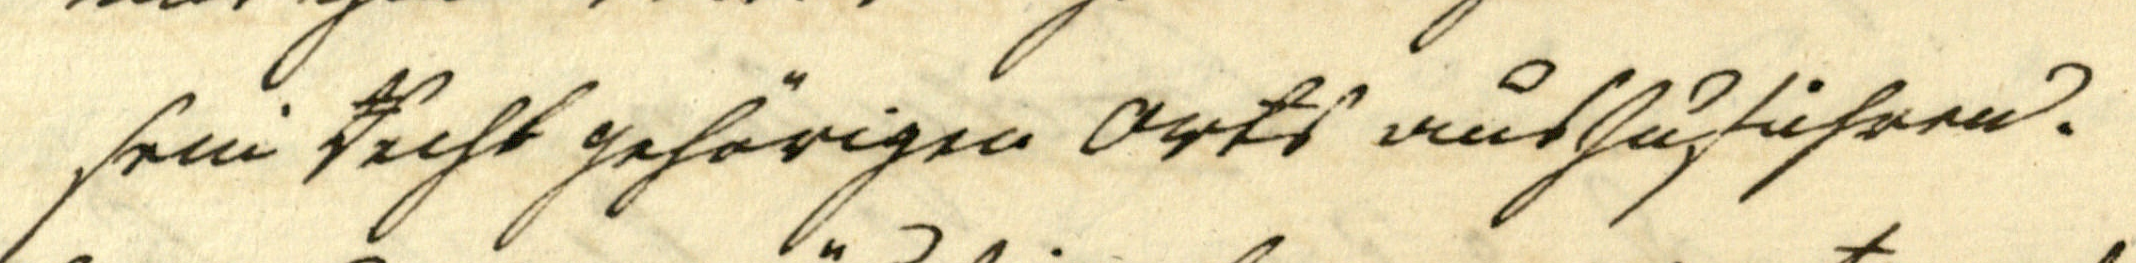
sein Recht gehörigen Orts auszuführen.
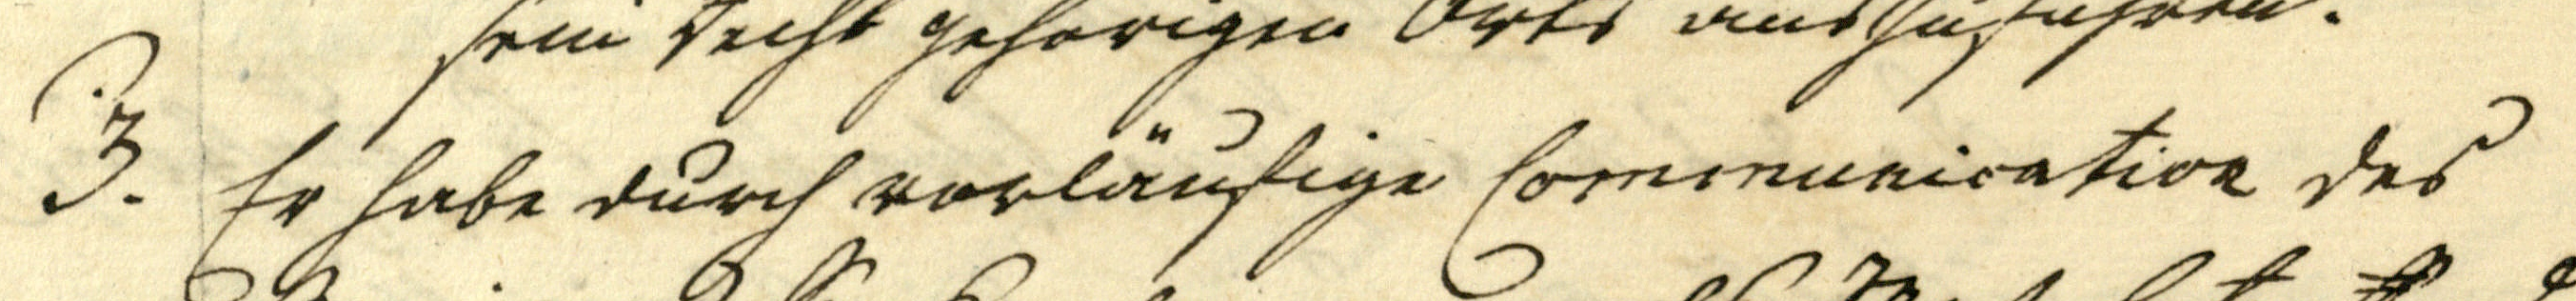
3. Er habe durch vorläufige Communication des
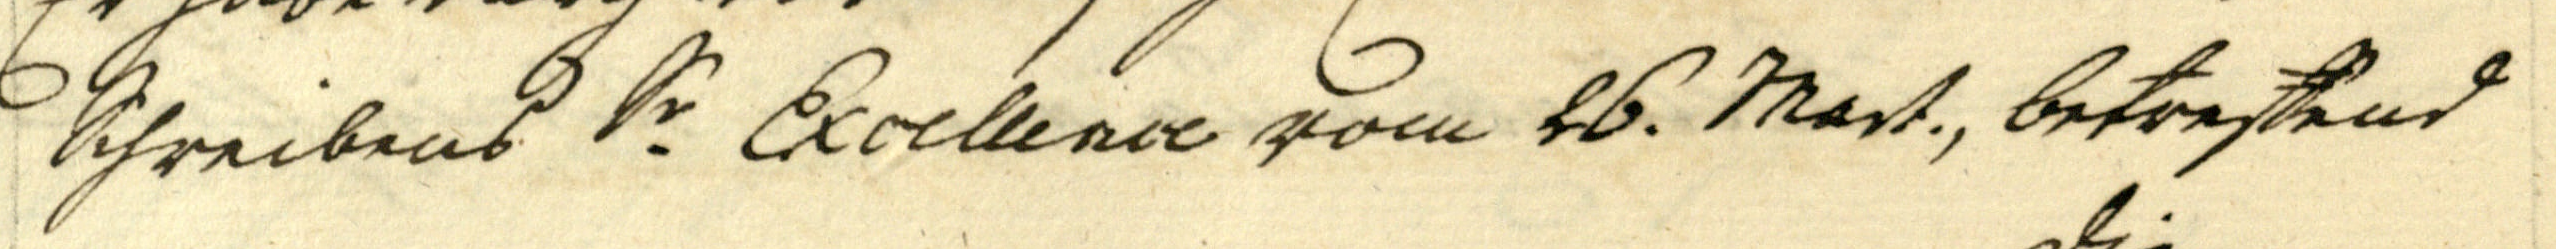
Schreibens Sr Excellence vom 26. Mart., betreffend
